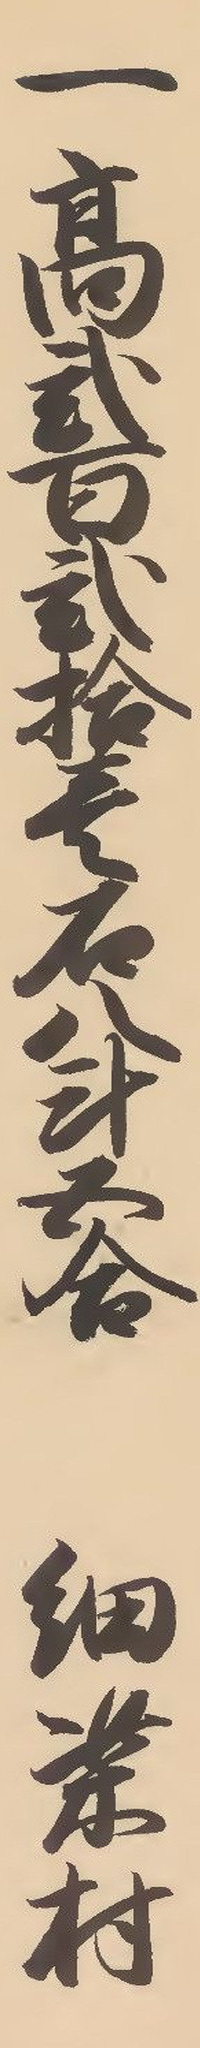一高弐百弐拾壱石八斗五合細柴村
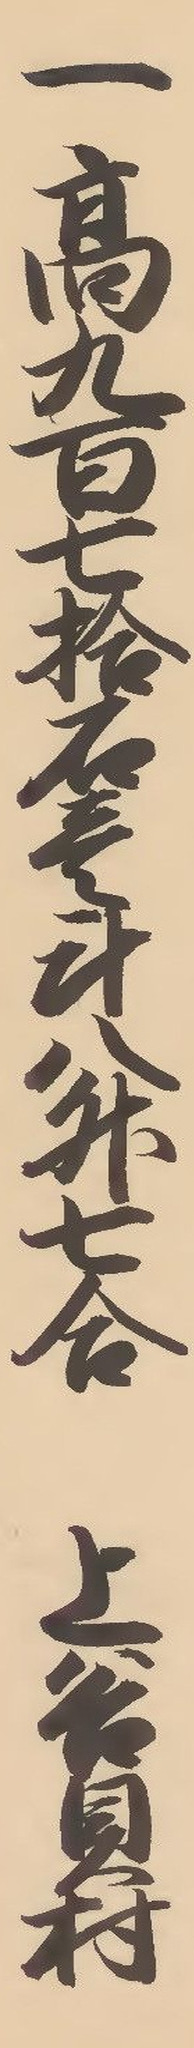一高九百七拾石壱斗八升七合上谷貝村

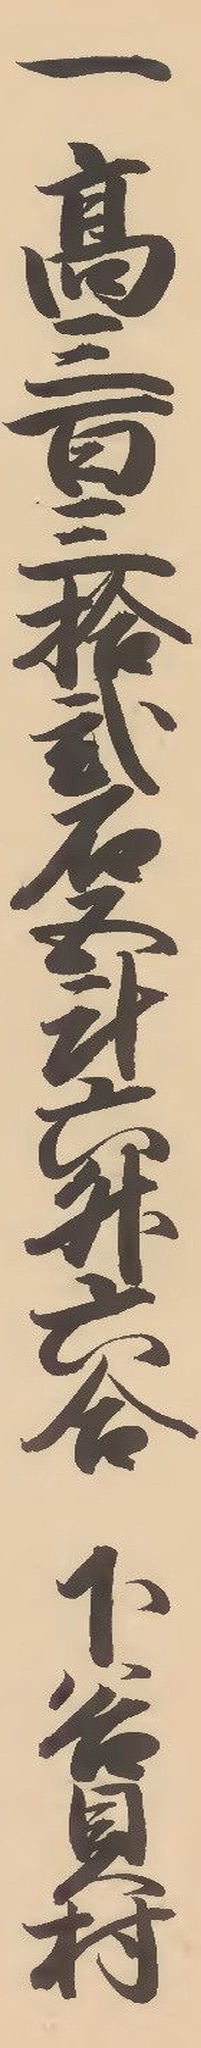一高三百三拾弐石五斗六升六合下谷貝村
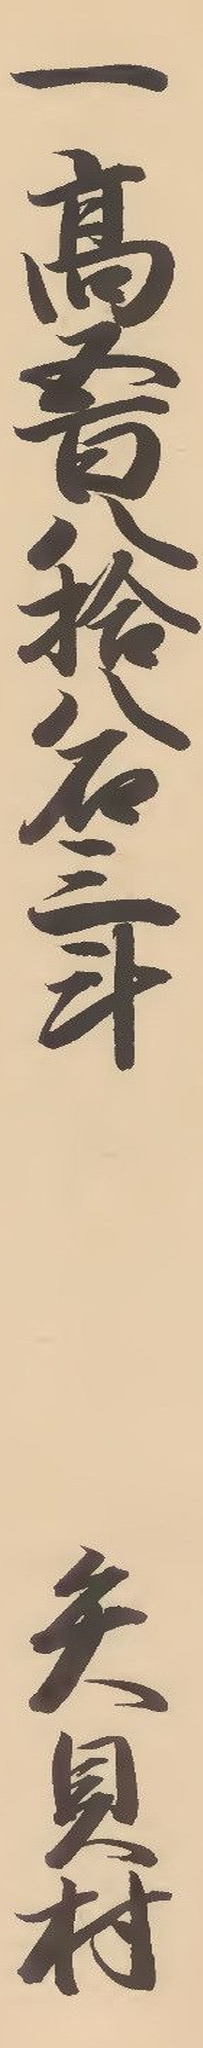一高五百八拾八石三斗矢貝村
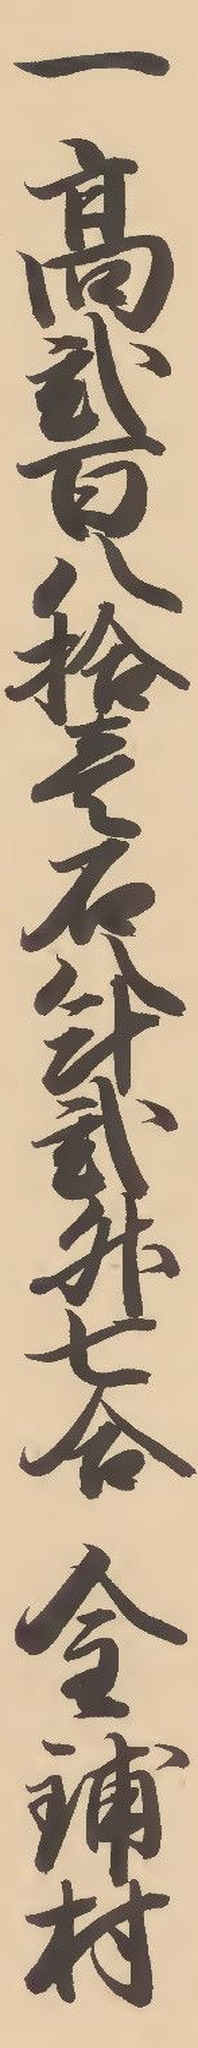一高弐百八拾壱石八斗弐升七合金鋪村
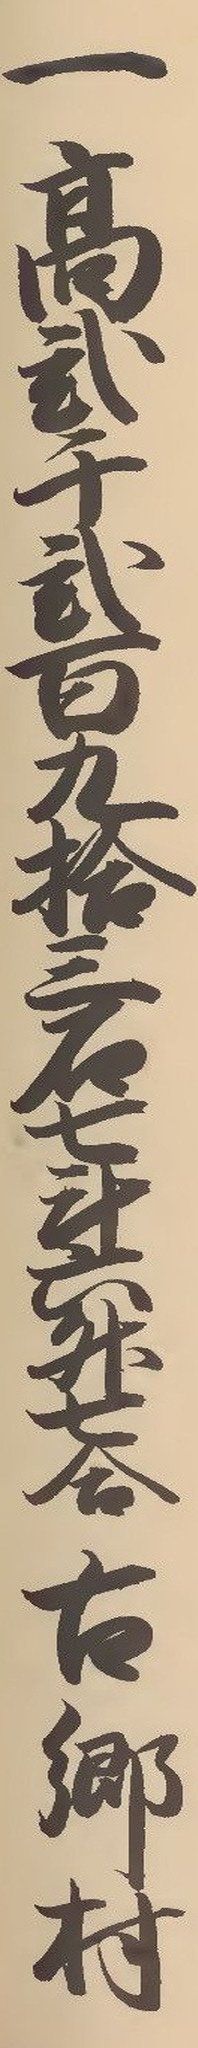一高弐千弐百九拾三石七斗六升七合古郷村
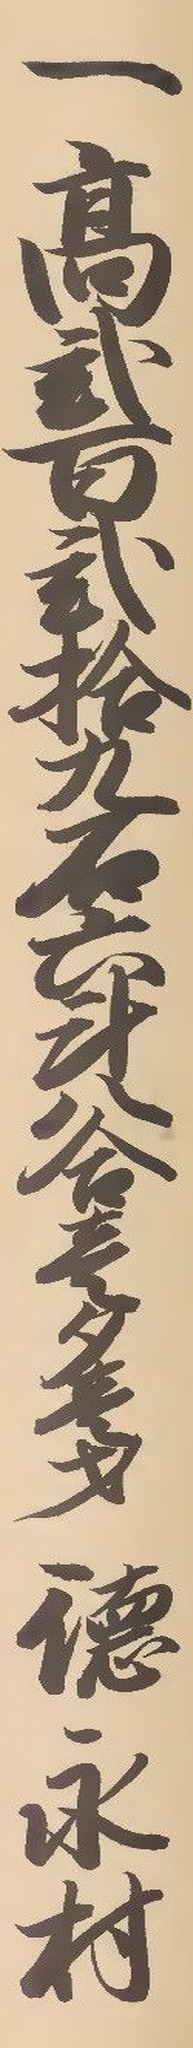一高弐百弐拾九石六斗八合壱勺壱才徳永村
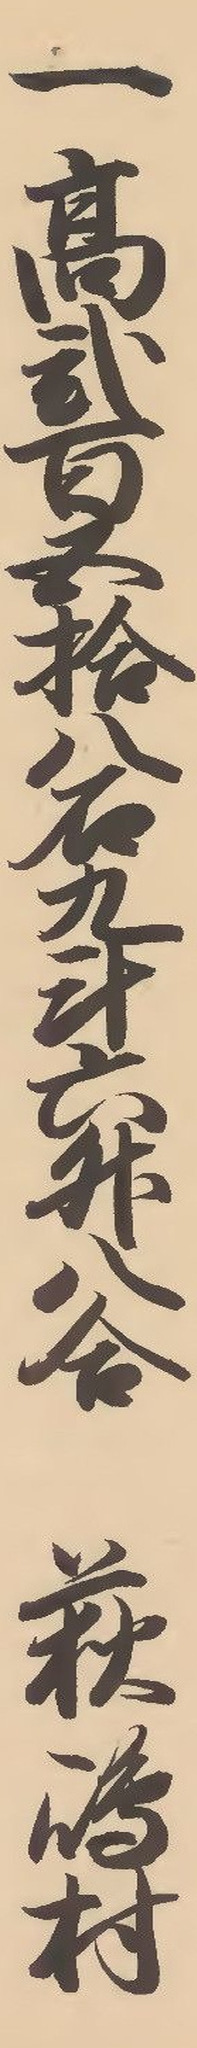一高弐百五拾八石九斗六升八合荻島村
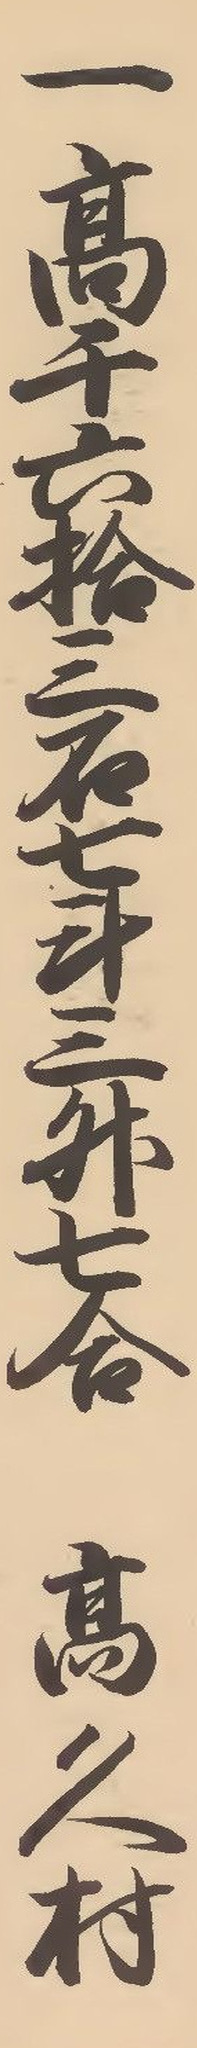一高千六拾三石七斗三升七合高久村
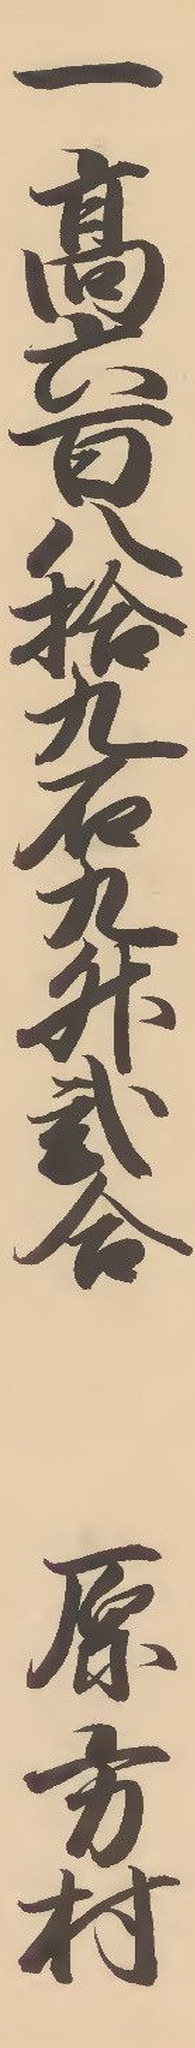一高六百八拾九石九升弐合原方村

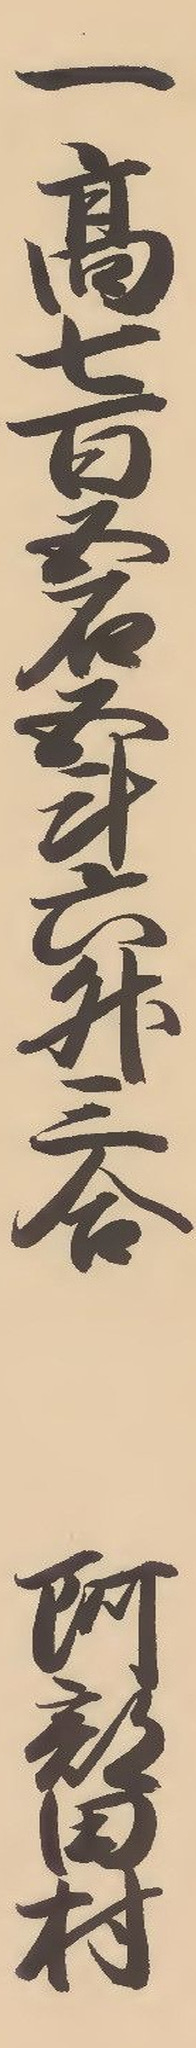一高七百五石五斗六升三合阿部田村
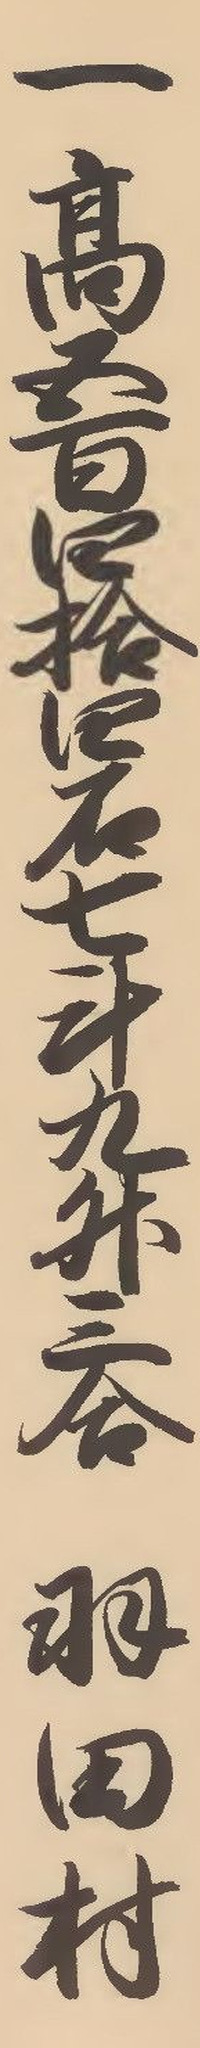一高五百四拾四石七斗九升三合羽田村
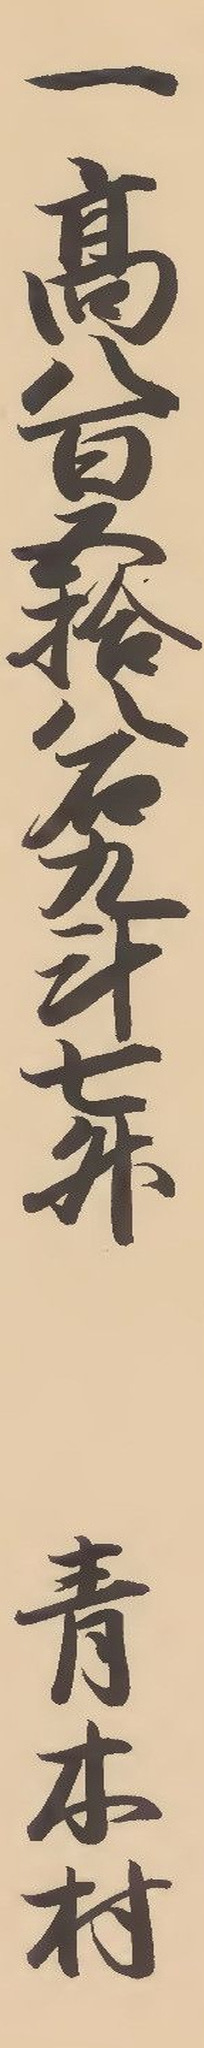一高八百五拾八石九斗七升青木村
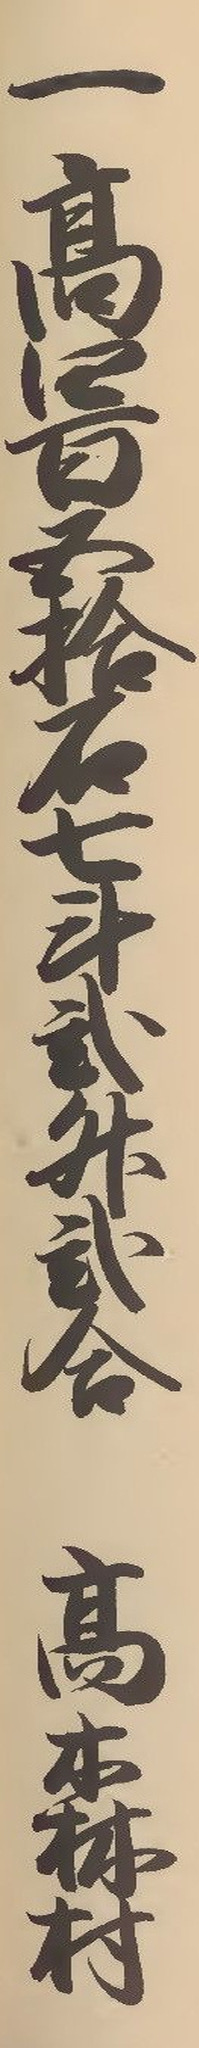一高四百五拾石七斗弐升弐合高森村
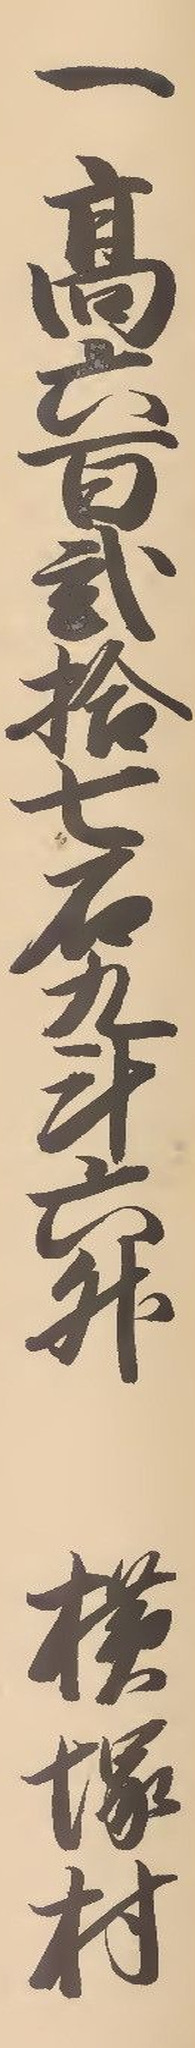一高六百弐拾七石九斗六升横塚村
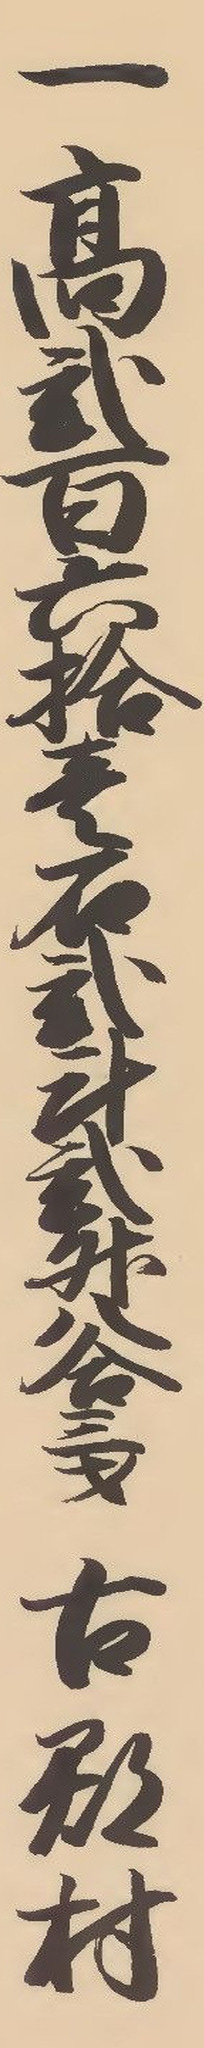一高弐百六拾壱石弐斗弐升八合三才古郡村
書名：常陸国郷帳
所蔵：国立公文書館 National Archives of Japan
